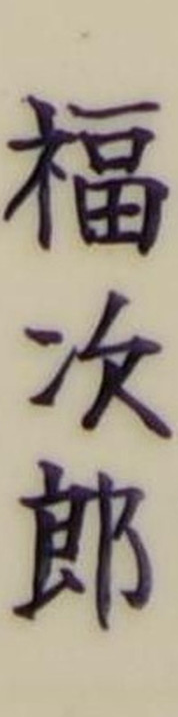福次郎

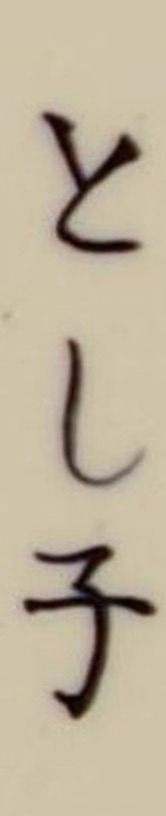とし子
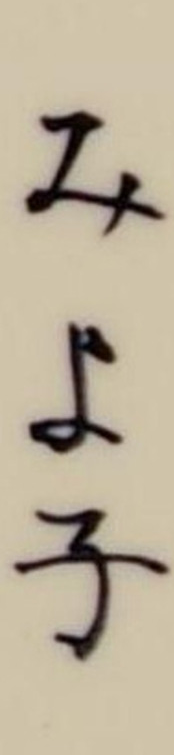みよ子
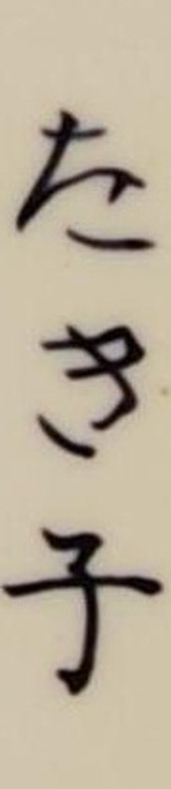たき子
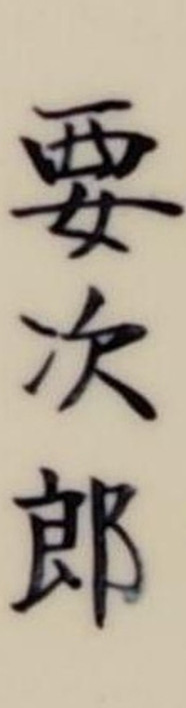要次郎
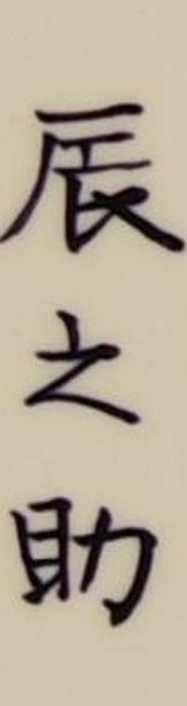辰之助
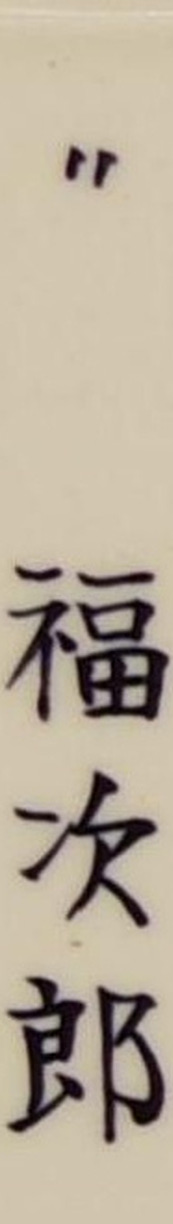福次郎
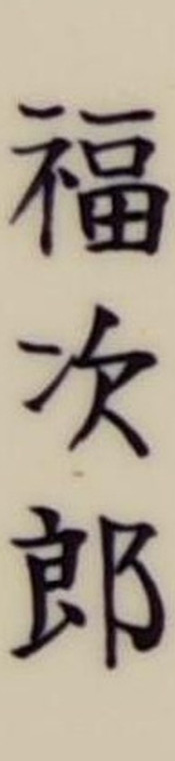福次郎
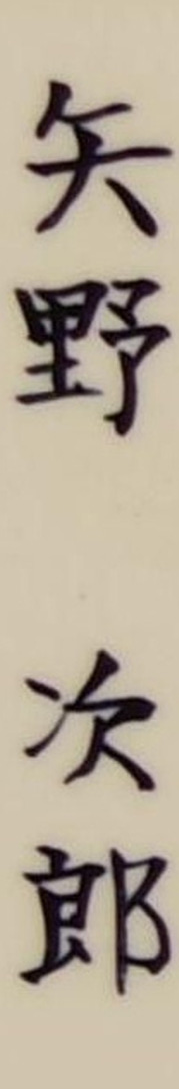矢野次郎
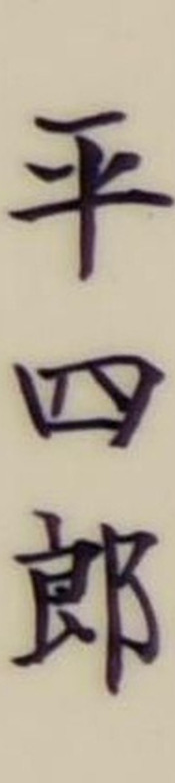平四郎

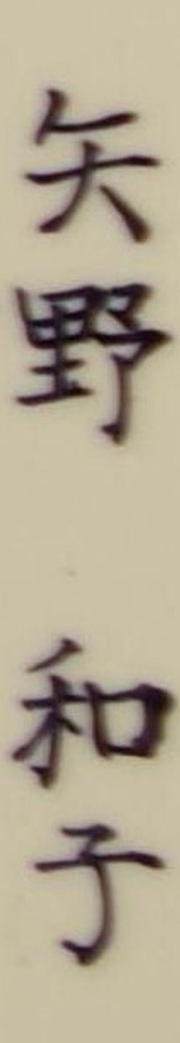矢野和子
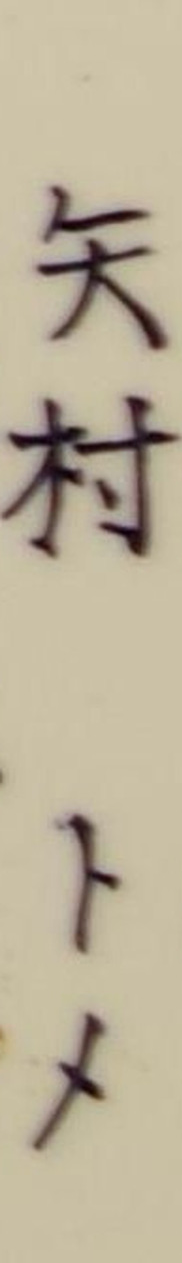矢村トメ
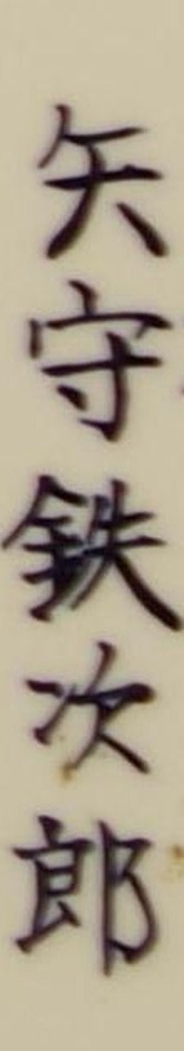矢守鉄次郎
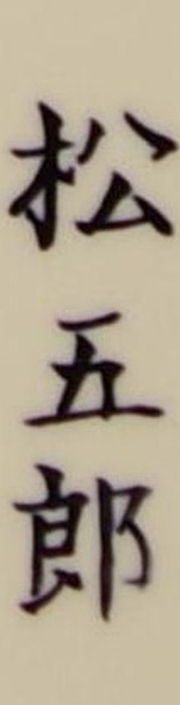松五郎
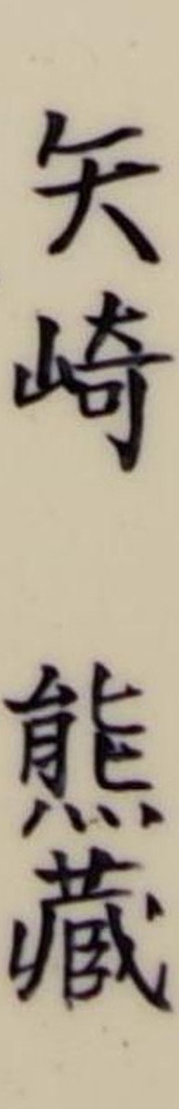矢崎熊蔵
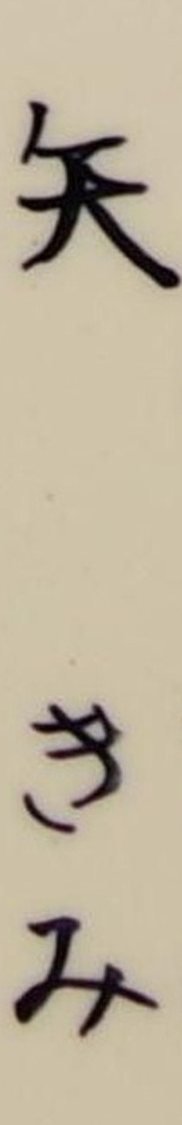矢きみ
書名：A~D
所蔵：koyasan kongobuji
